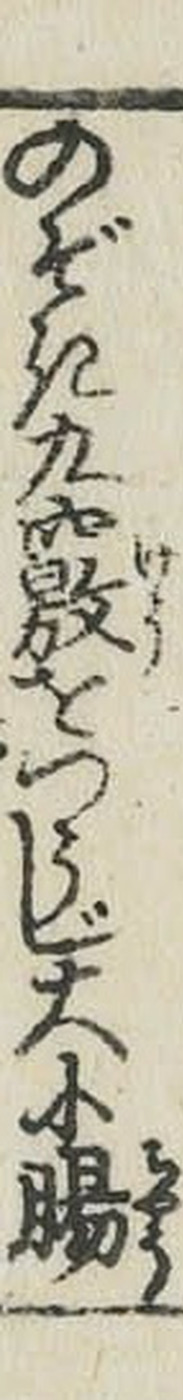のぞき九竅をつうじ大小腸
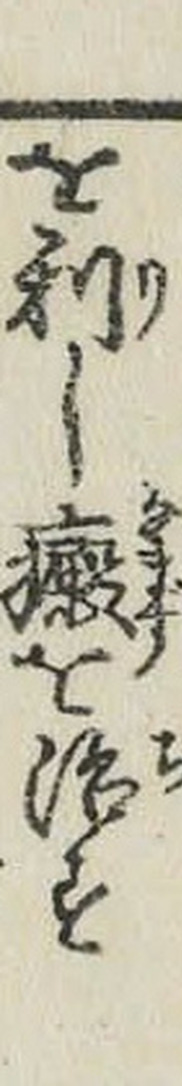を利し癜を治す
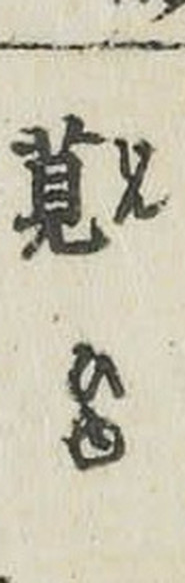莧ひゆ
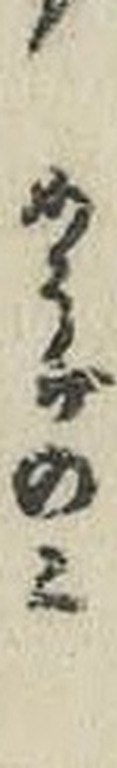めうがのこ
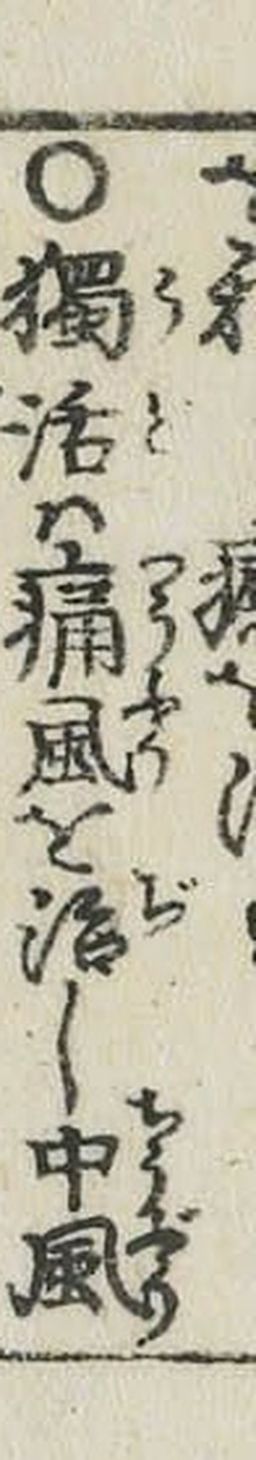○独活は痛風を治し中風
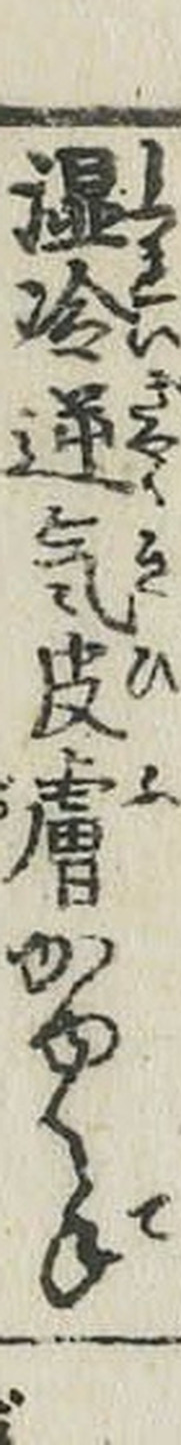湿冷逆気皮膚かゆく手
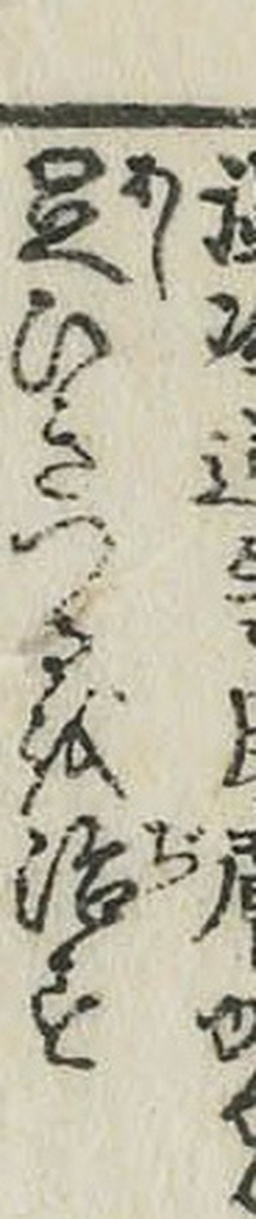足ひきつるを治す
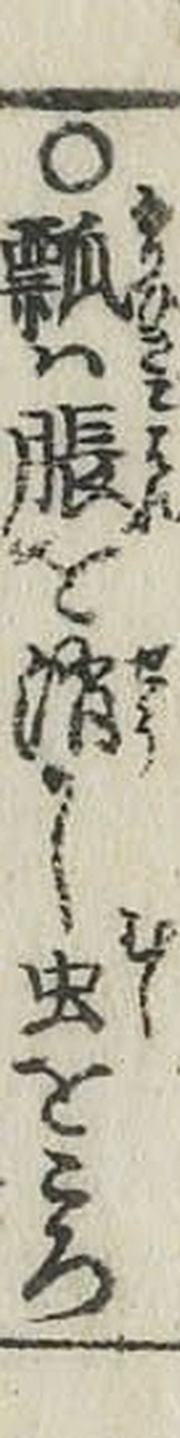○瓢は脹を消し虫をころ
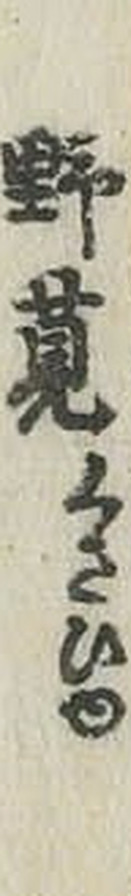野莧くさひゆ
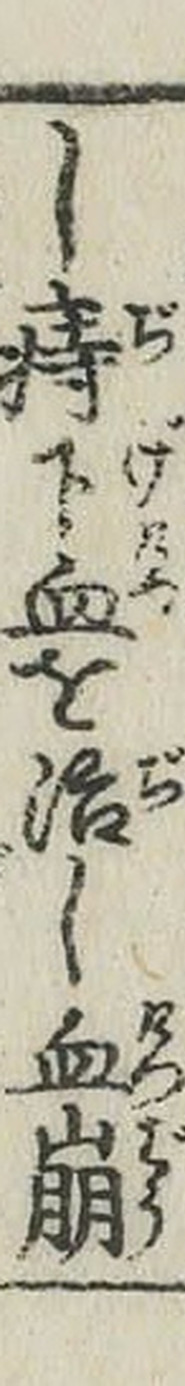し痔下血を治し血崩
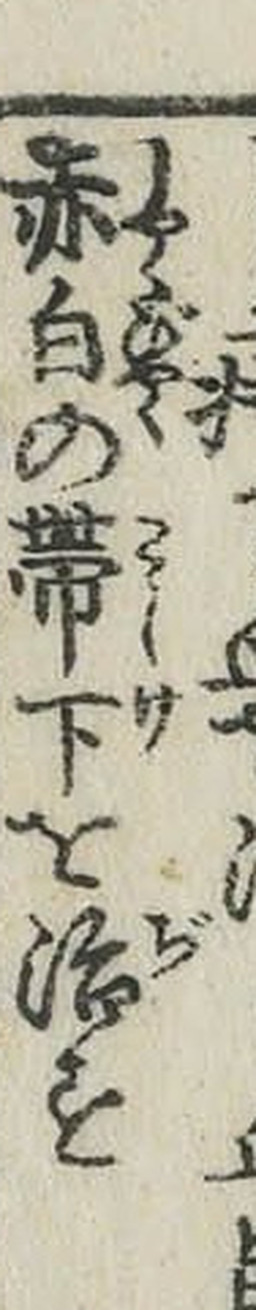赤白の帯下を治す

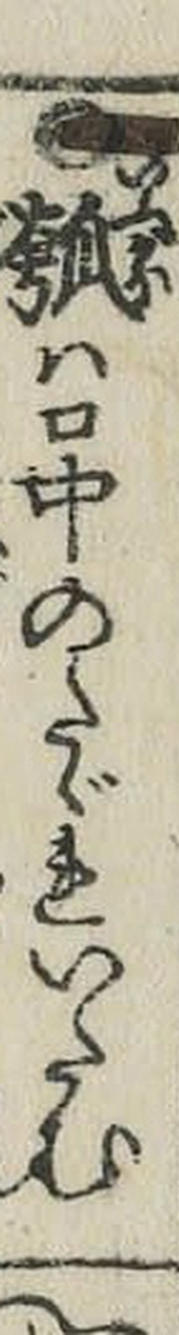○瓠は口中のただれいたむ
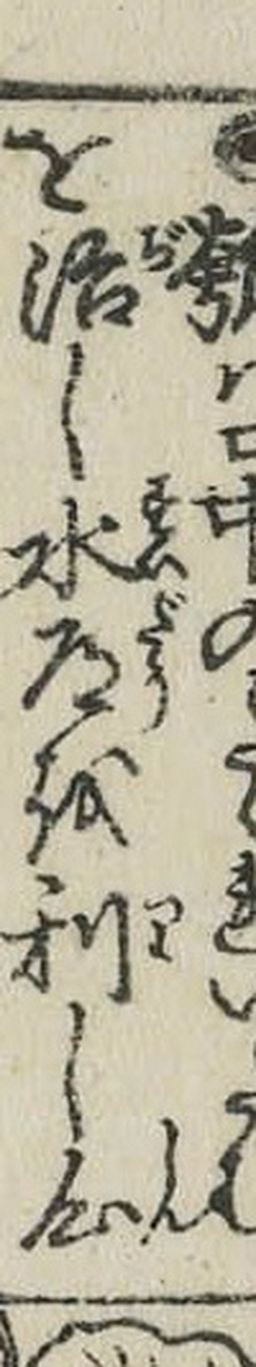を治し水道を利し心
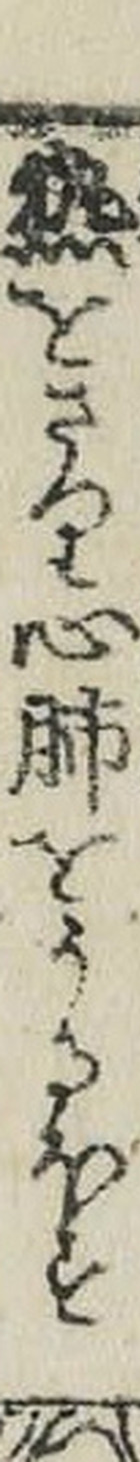熱をさり心肺をうるほす
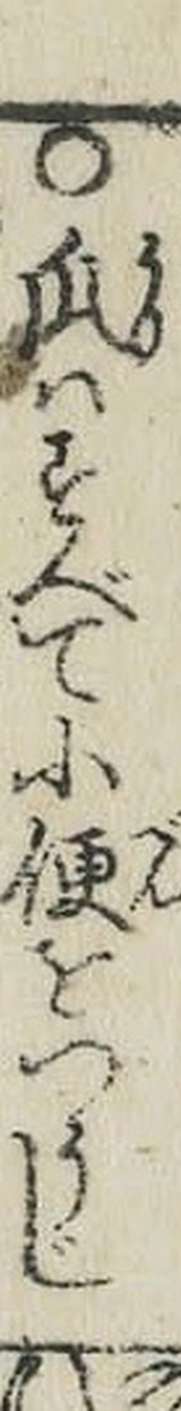○瓜はすべて小便をつうじ
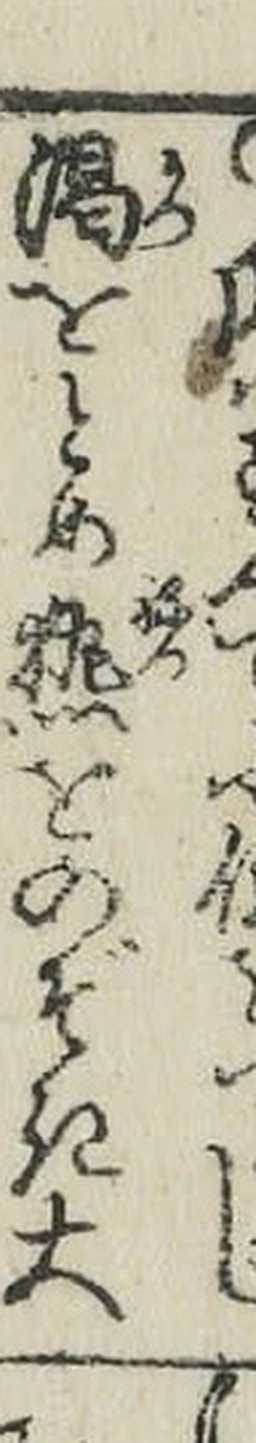渇をとめ熱をのぞき大
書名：増補頭書訓蒙図彙大成 10巻 8:巻之17-19
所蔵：東京学芸大学教育コンテンツアーカイブ
